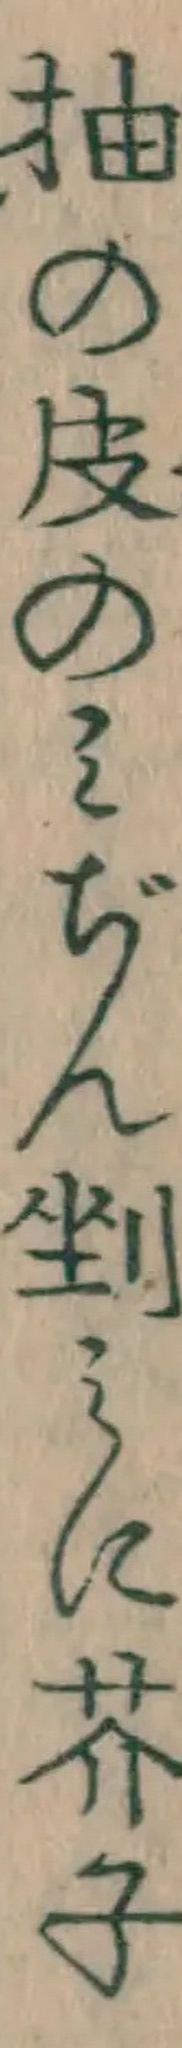柚の皮のみぢん剉みに芥子
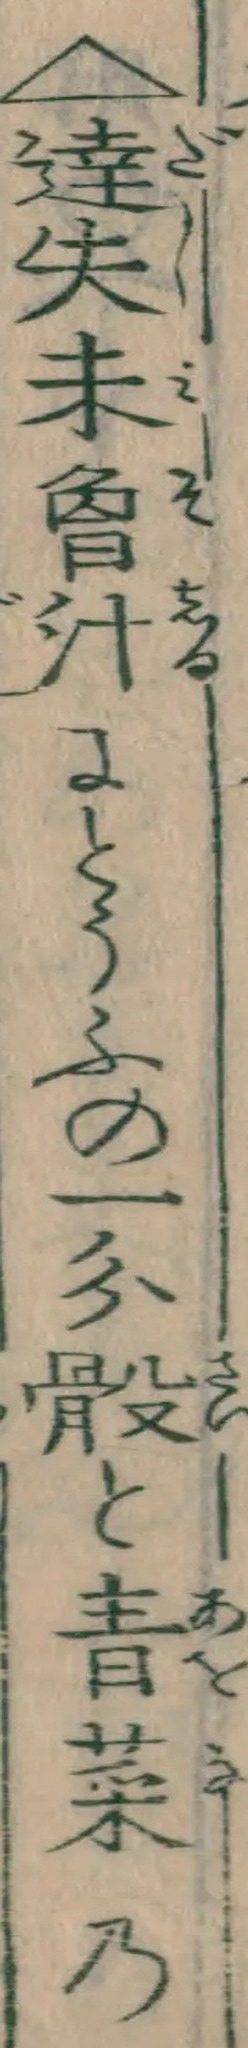△達失未曽汁にとうふの一分骰と青菜の
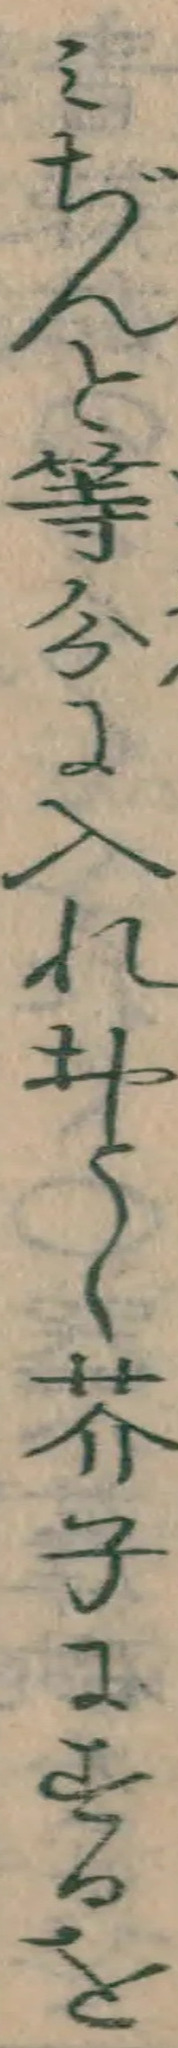みぢんと等分に入れおとし芥子にするを
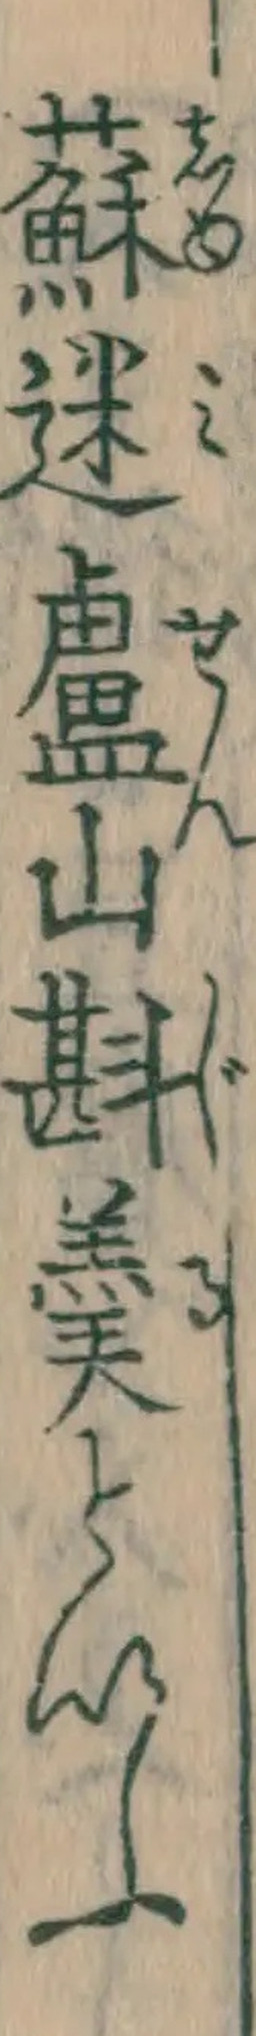蘇迷盧山斟羹といふ
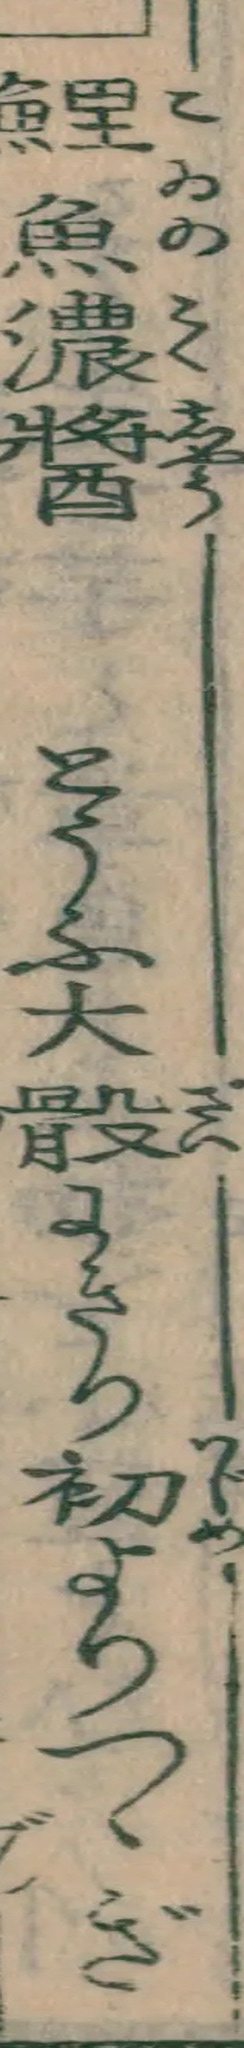三鯉魚濃醤とうふ大骰にきり初よりつゝぎ
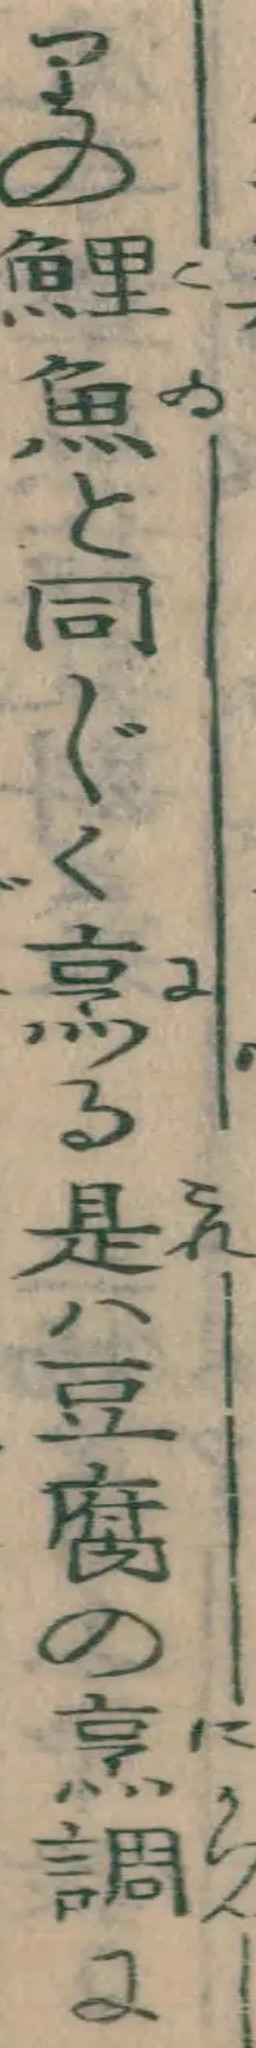りの鯉魚と同じく烹る是は豆腐の烹調に
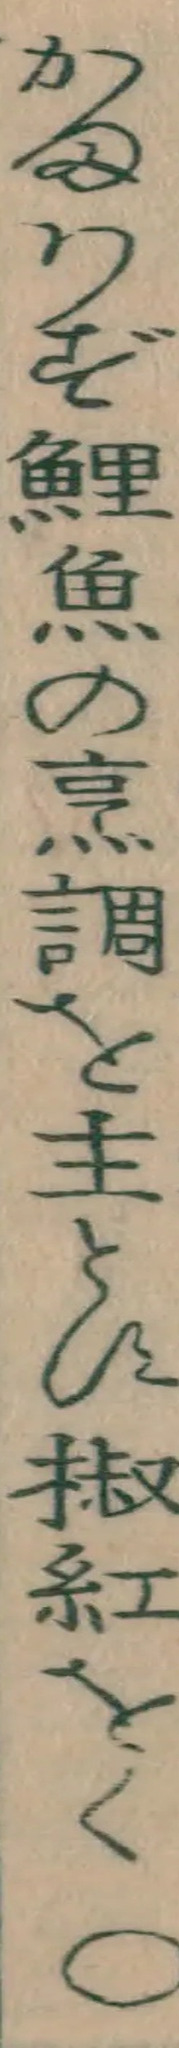かまはず鯉魚の烹調を主とす椒紅をく○
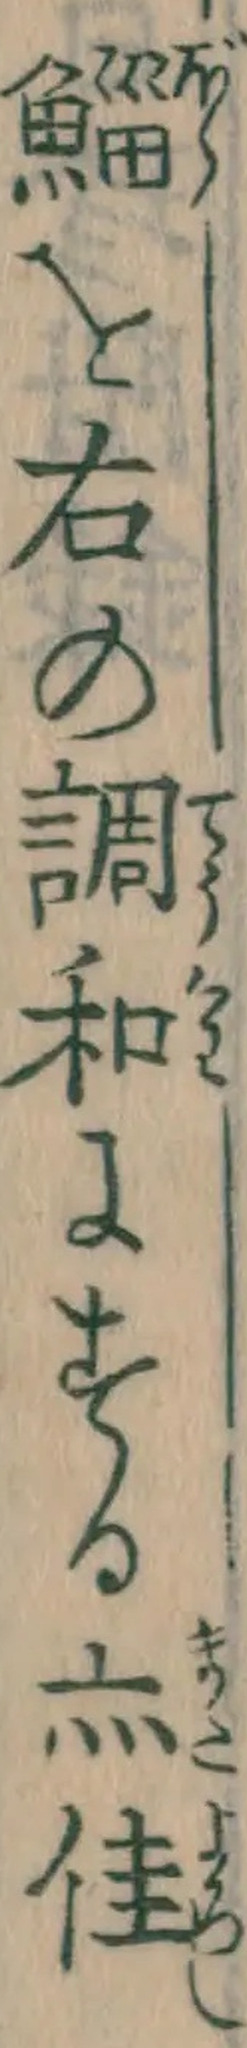鰡を右の調和にする亦佳
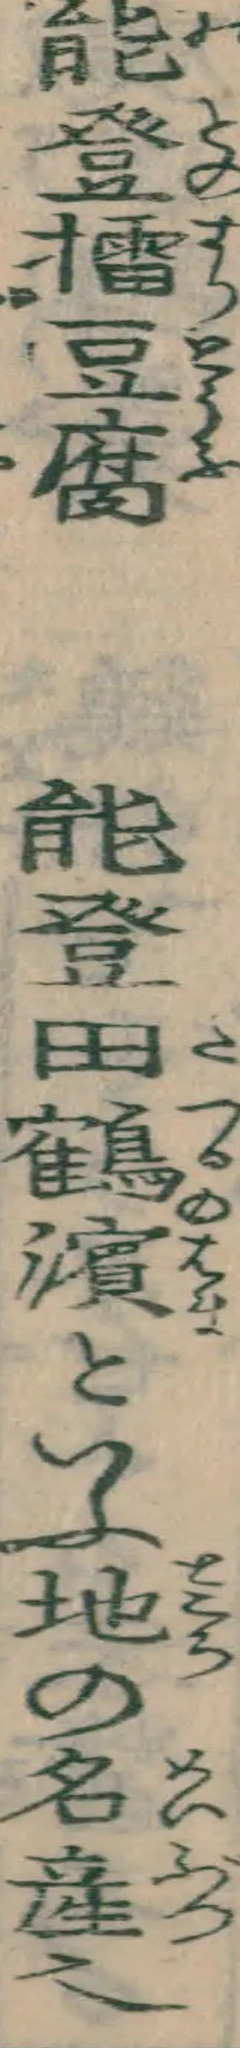四能登擂豆腐能登田鶴浜といふ地の名産也
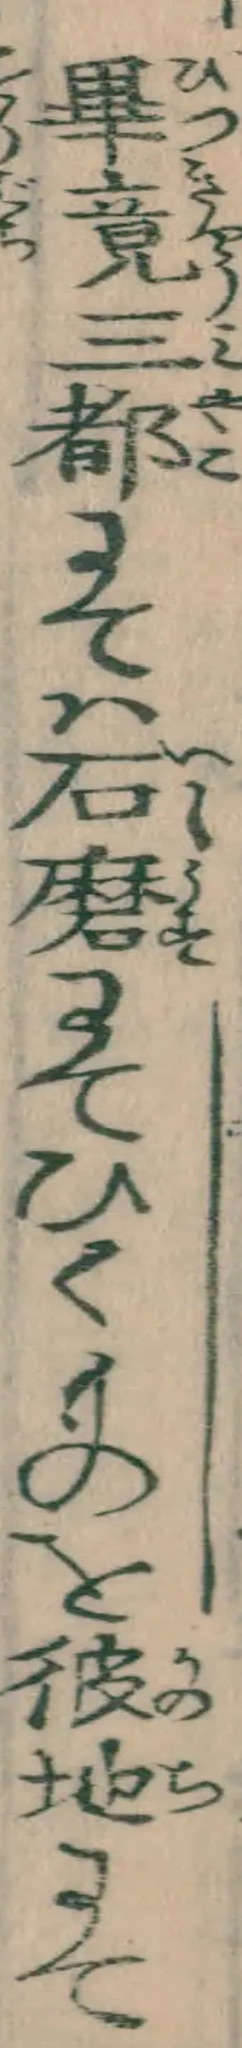畢竟三都にては石磨にてひくものを彼地にて
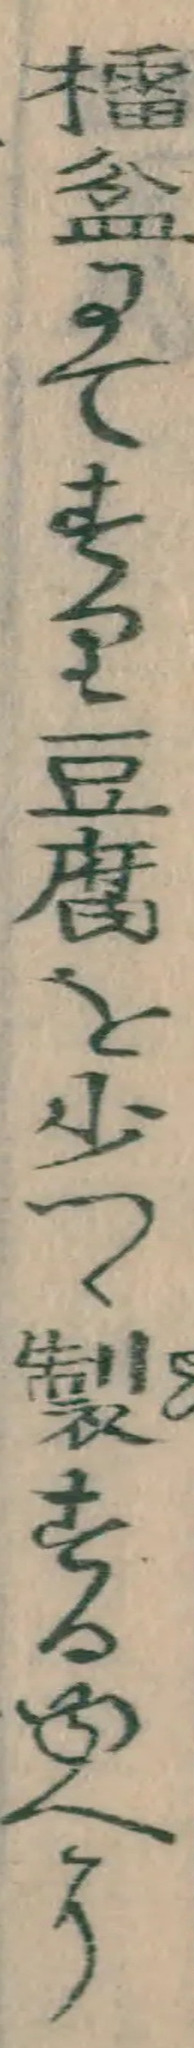擂盆にてすり豆腐を少つゝ製するゆへに
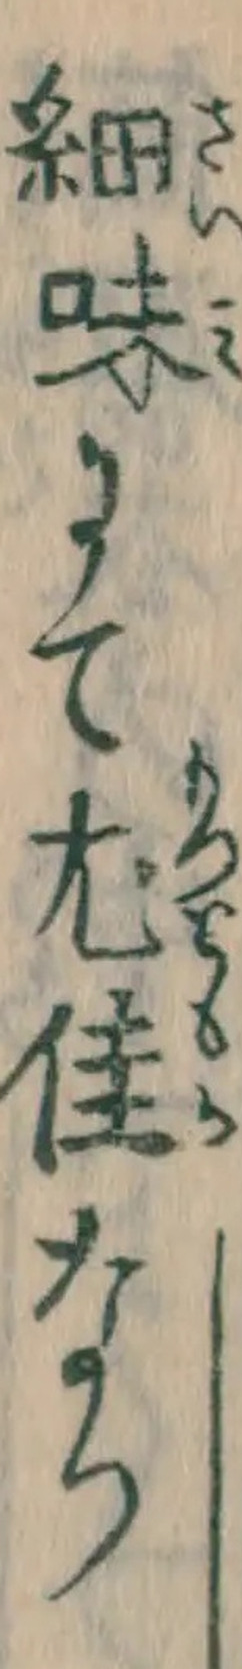細味にて尤佳なり
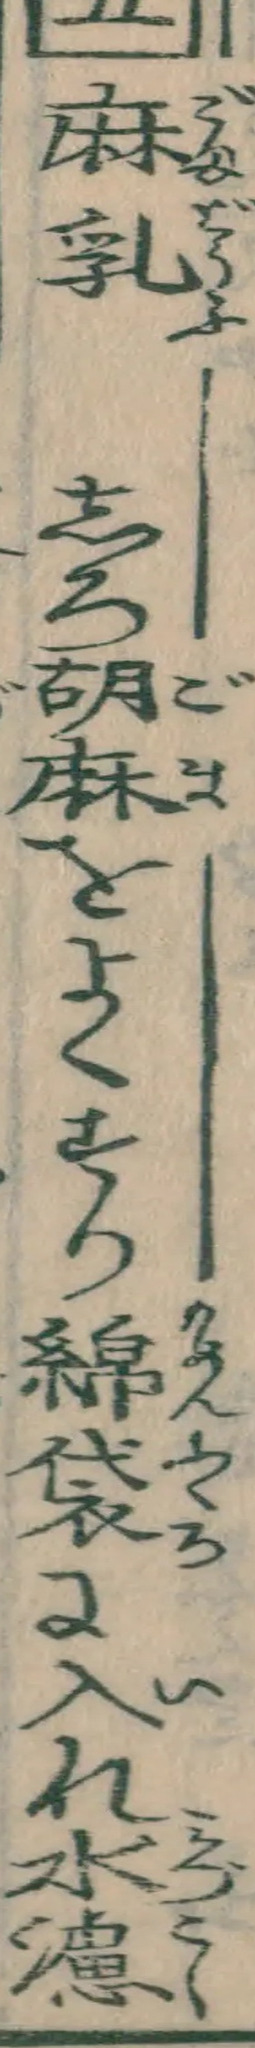五麻乳しろ胡麻をよくすり綿袋に入れ水濾
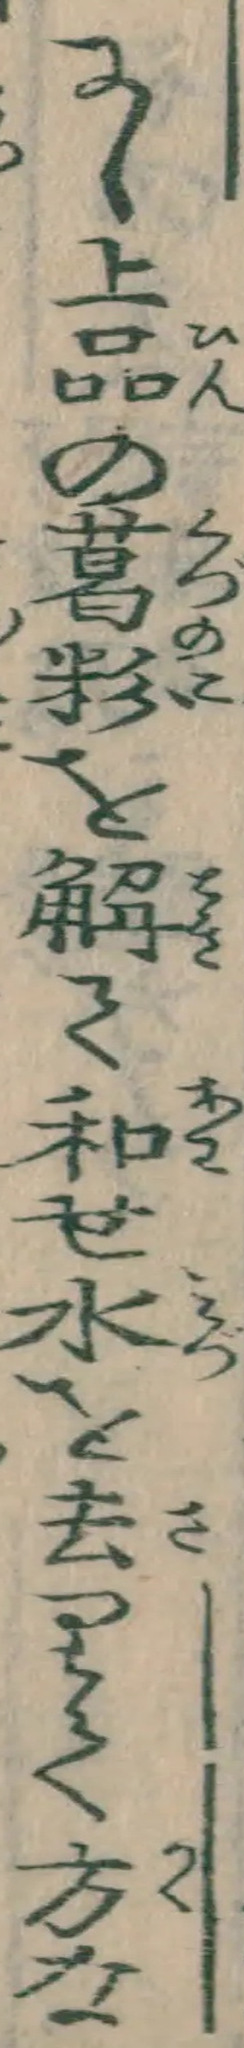にし上品の葛粉を解て和せ水を去りて方な
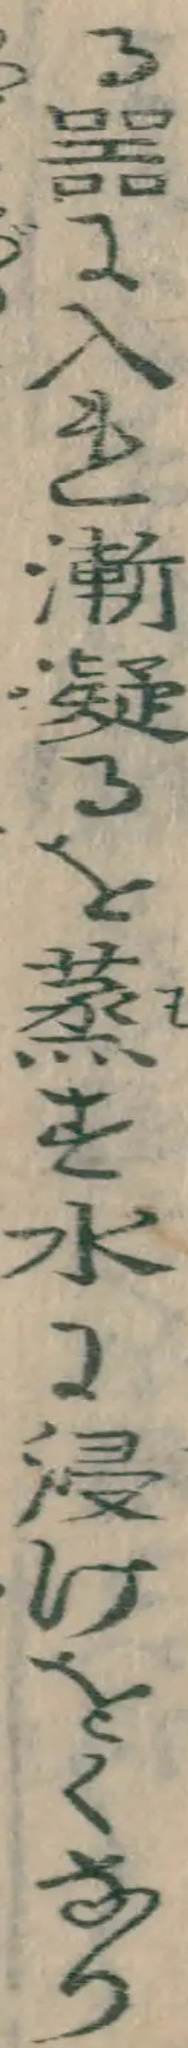る器に入れ漸凝るを蒸す水に浸けをくなり
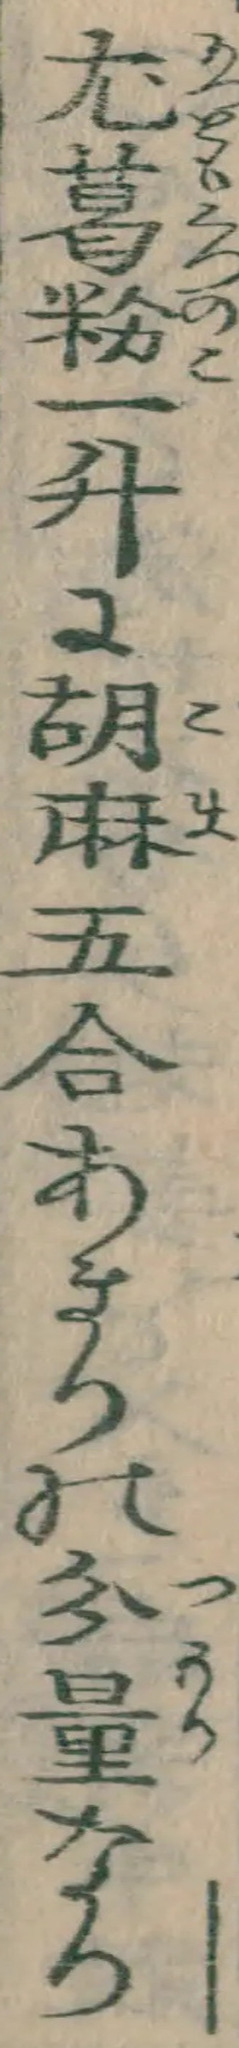尤葛粉一升に胡麻五合あまりの分量なり
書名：豆腐百珍. 続編
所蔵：国立国会図書館 National Diet Library, JAPAN
